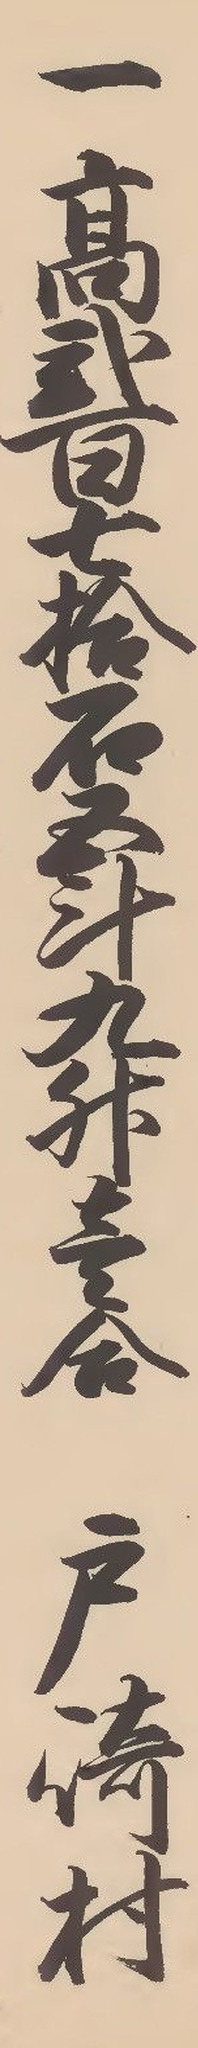一高弐百七拾石五斗九升壱合戸崎村
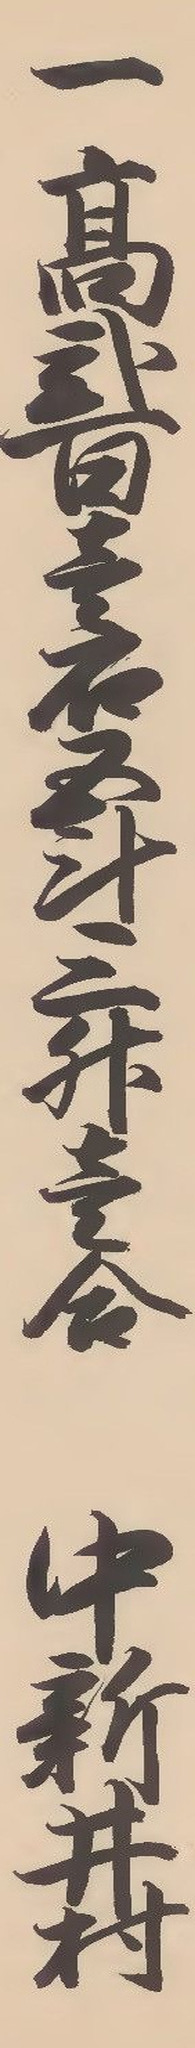一高弐百壱石五斗三升壱合中新井村
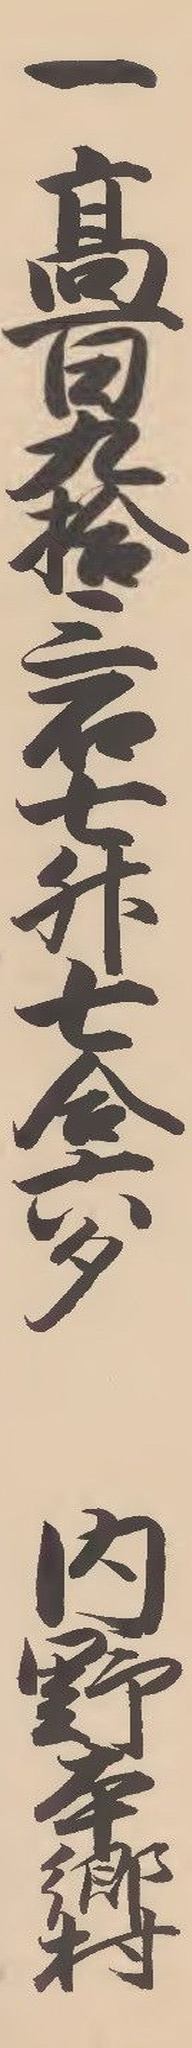一高百九拾三石七升七合六勺内野平郷村
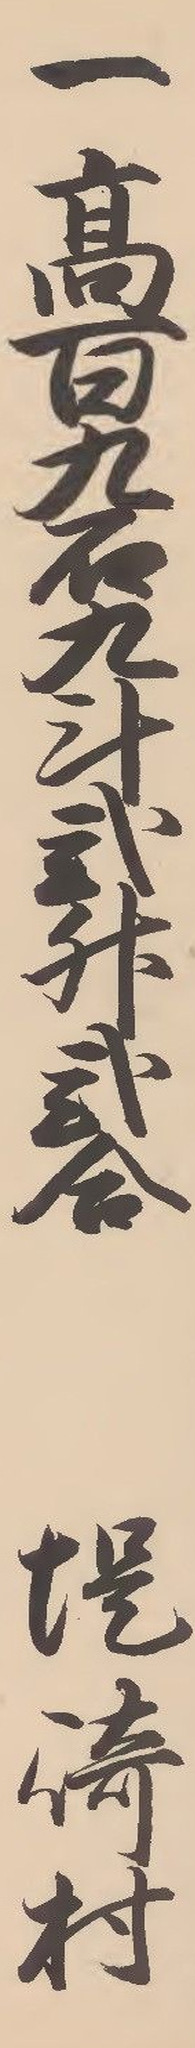一高百九石九斗弐升弐合堤崎村
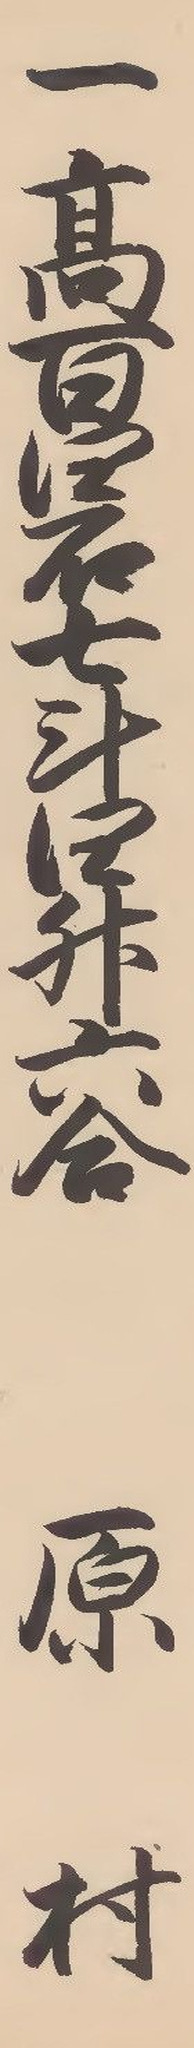一高百四石七斗四升六合原村
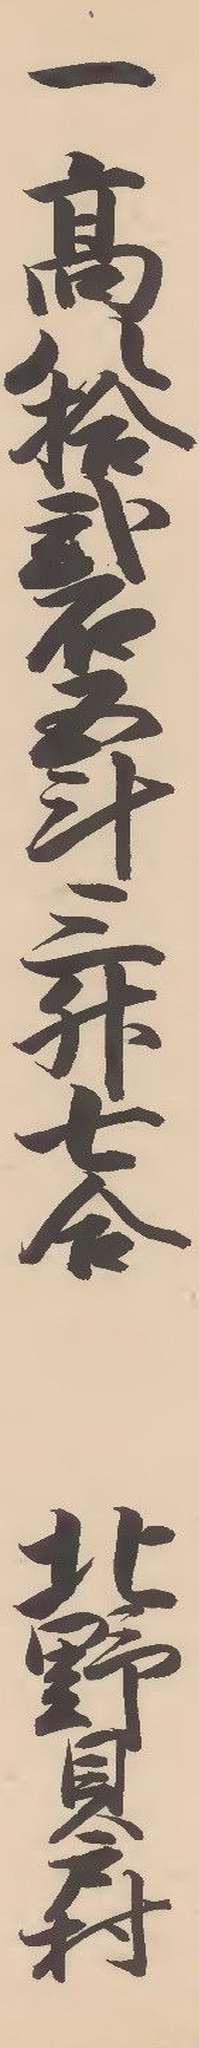一高八拾弐石五斗三升七合北野貝戸村
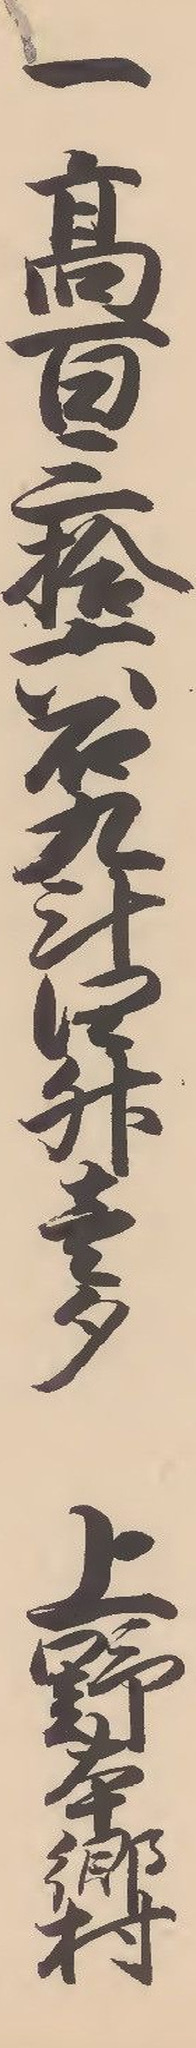一高百三拾六石九斗四升壱勺上野本卿村

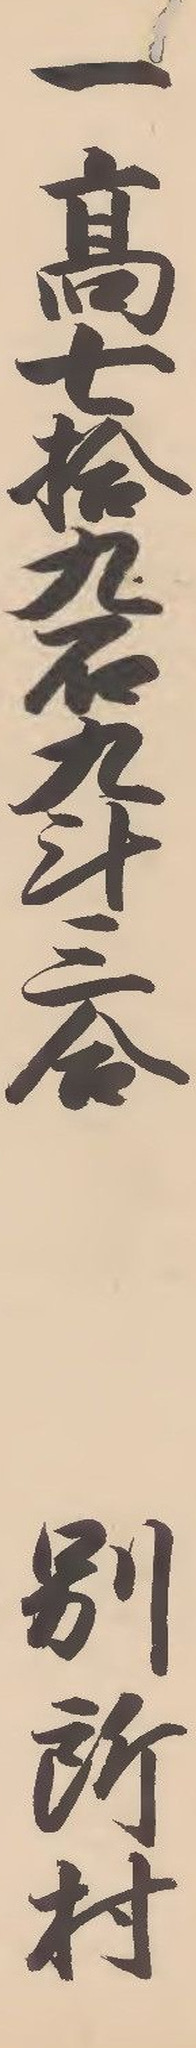一高七拾九石九斗三合別所村
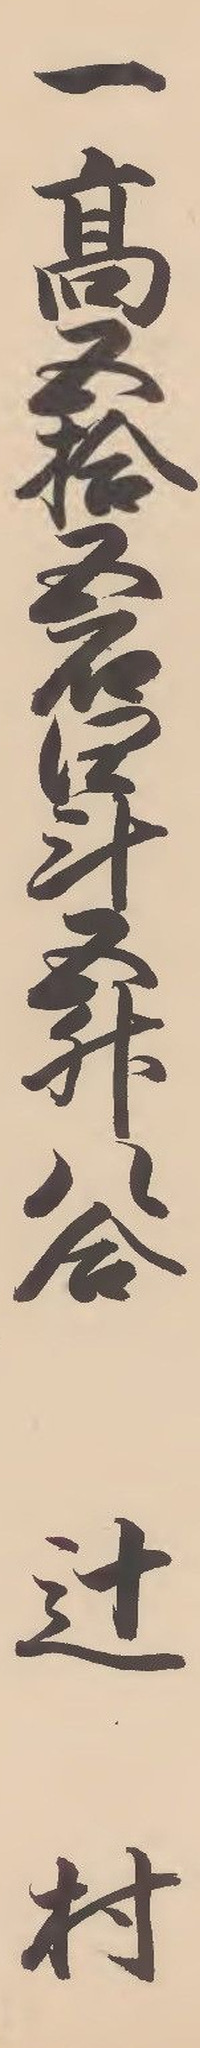一高五拾五石四斗五升八合辻村
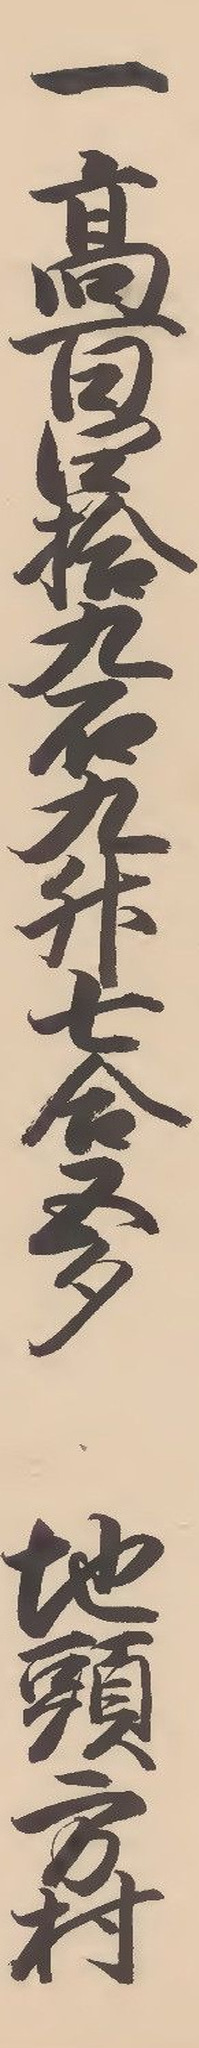一高百四拾九石九升七合五勺地頭方村
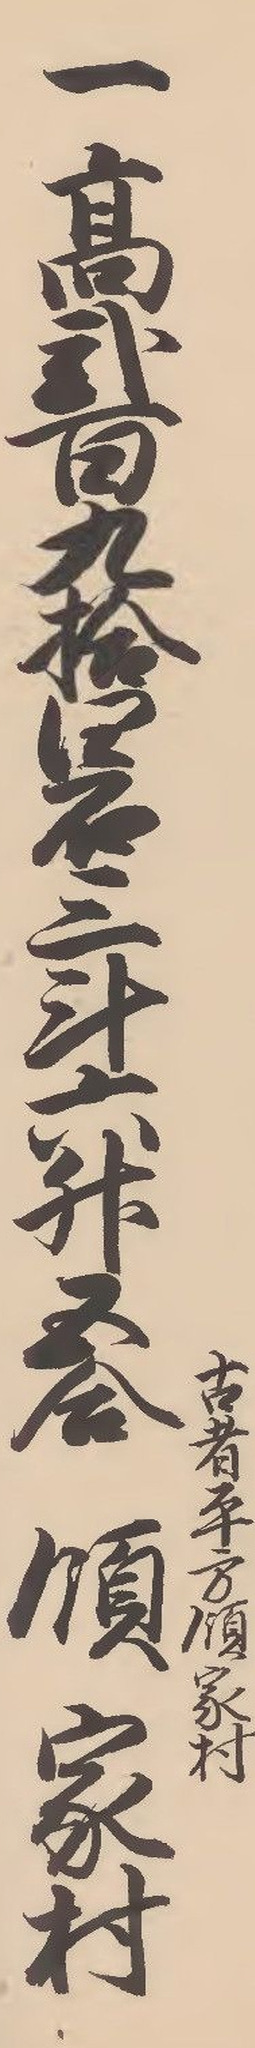一高弐百九拾四石三斗六升五合領家村
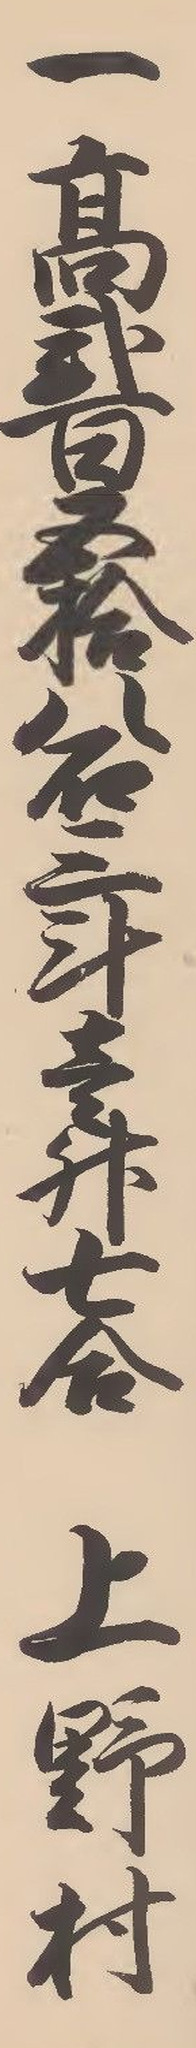一高弐百五拾八石三斗壱升七合上野村
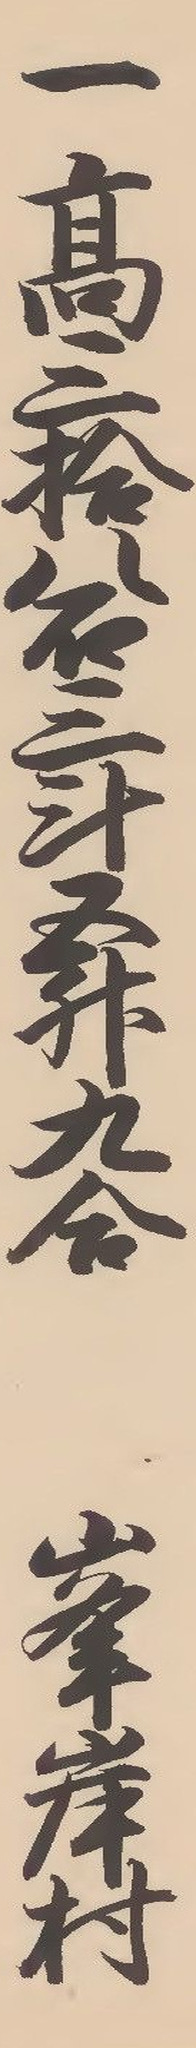一高三拾八石三斗五升九合峯岸村
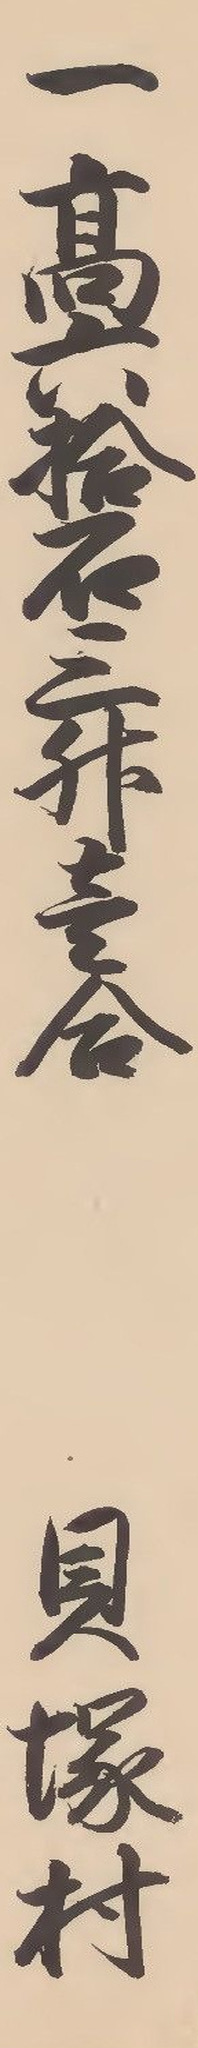一高六拾石三升壱合貝塚村
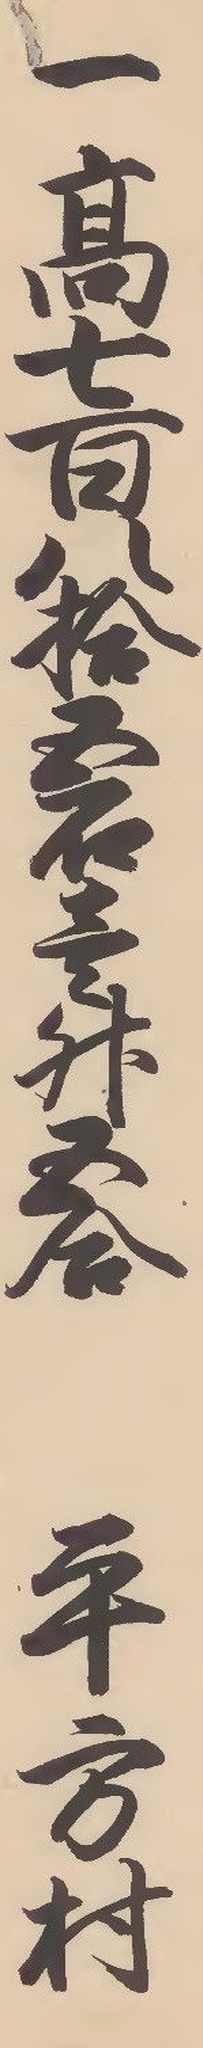一高七百八拾五石壱升五合平方村

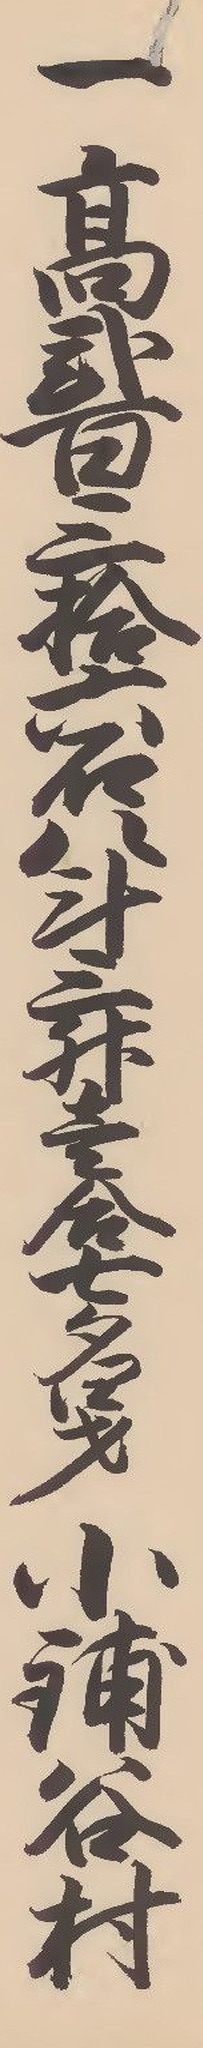一高弐百三拾六石八斗三升壱合七勺四才小舗谷村
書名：武蔵国郷帳　下
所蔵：国立公文書館 National Archives of Japan
